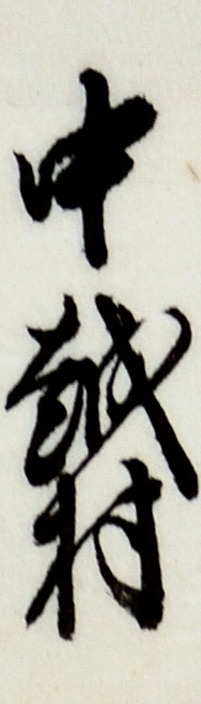中越村
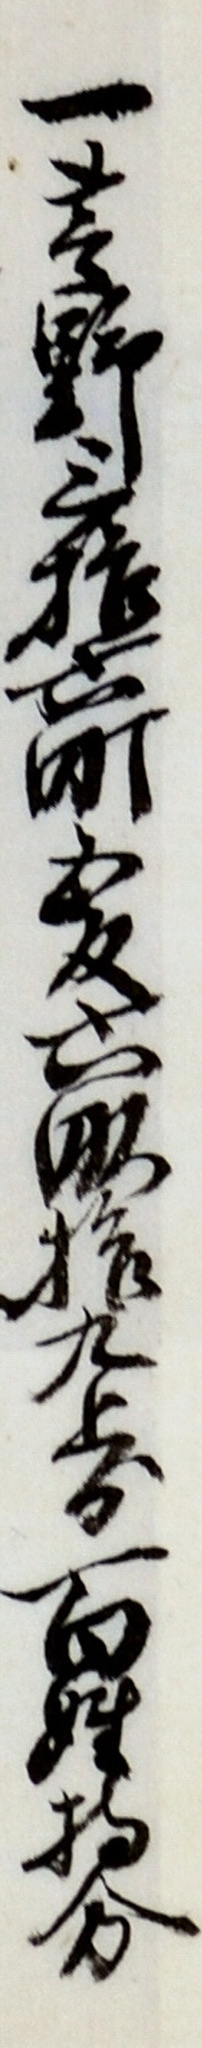一芝野三拾六町五反六畝拾九歩百姓持分
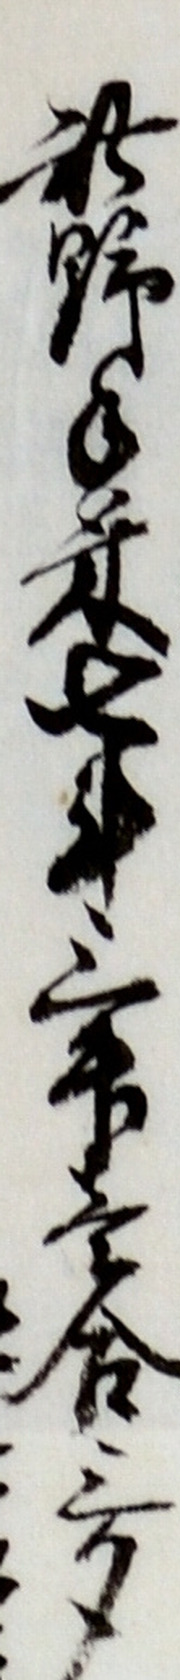此野手米七斗三升壱合三勺
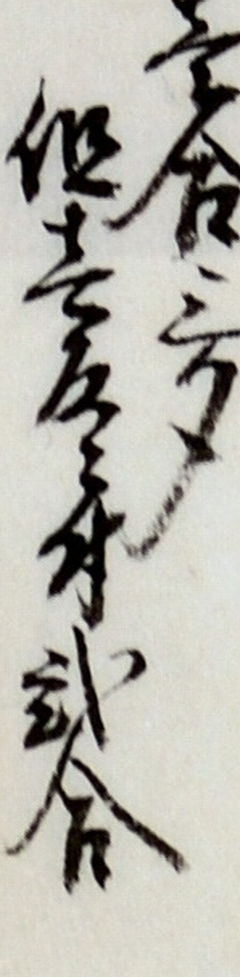但壱反ニ付弐合
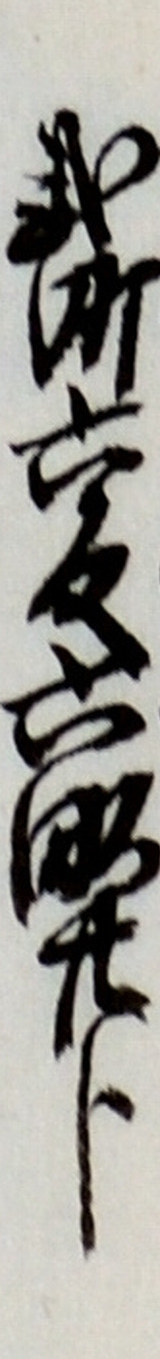弐町六反六畝廿歩村中
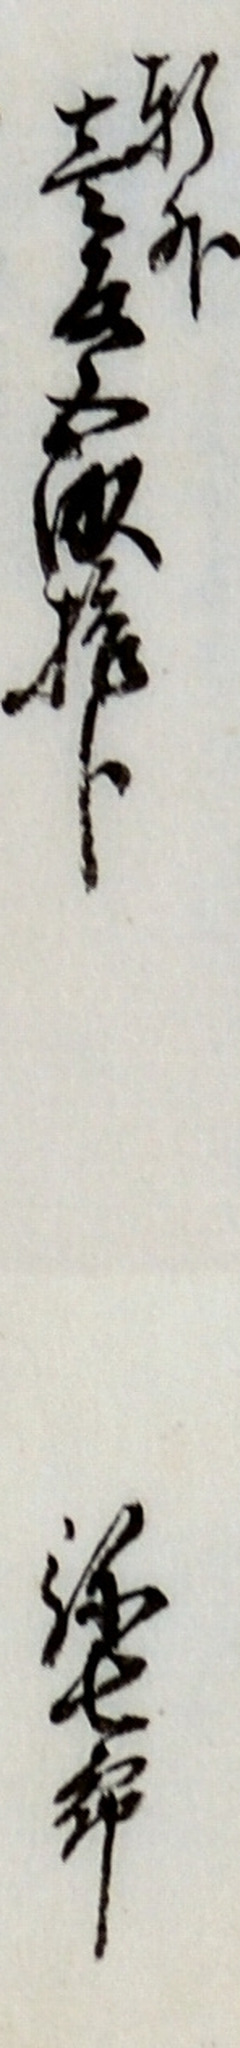壱反五畝拾歩弥七郎
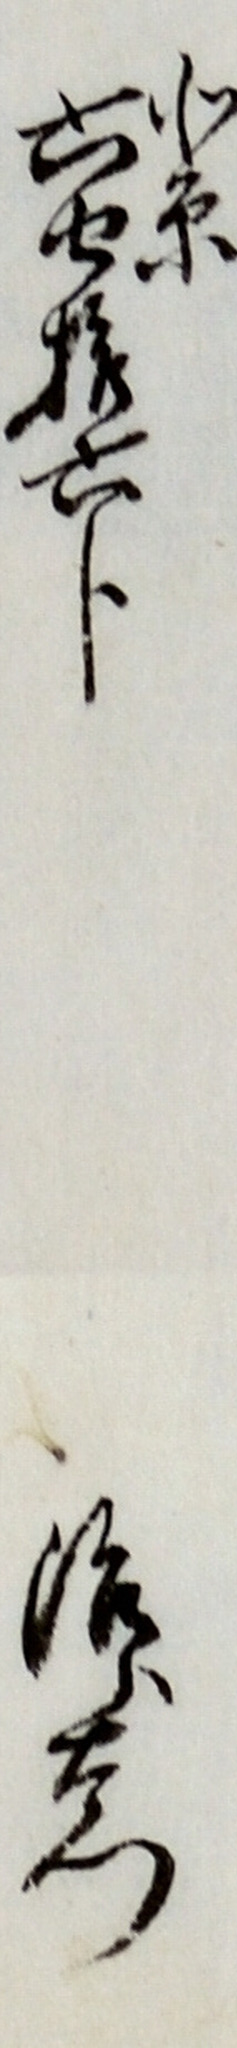六セ拾六歩治郎右衛門
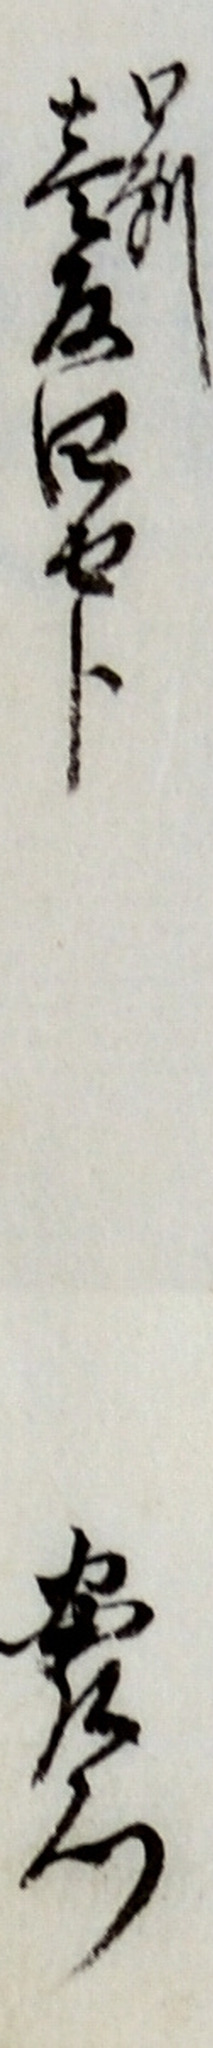壱反四セ歩安左衛門
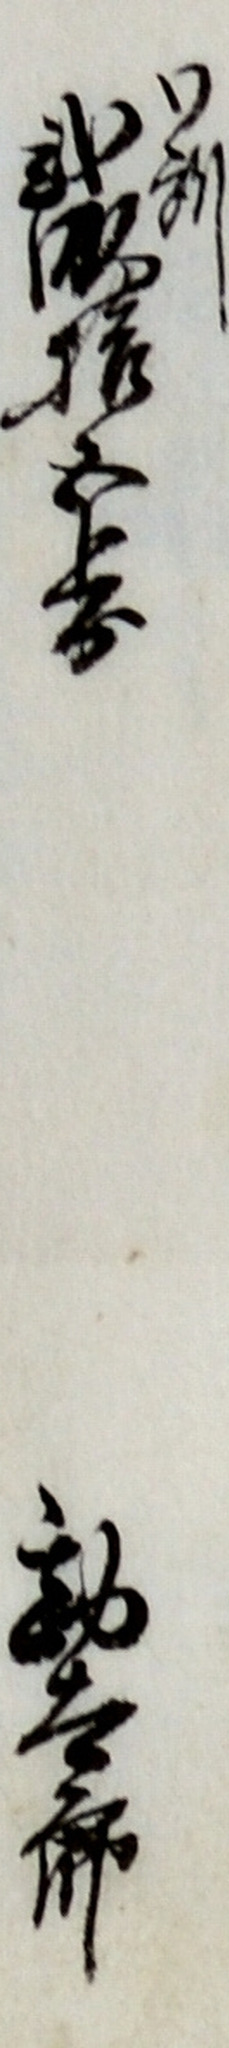弐畝拾五歩勘太郎

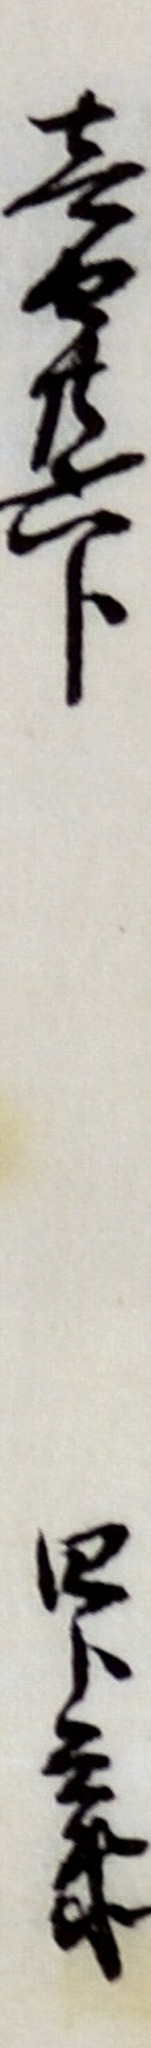壱セ廿六歩四郎兵衛
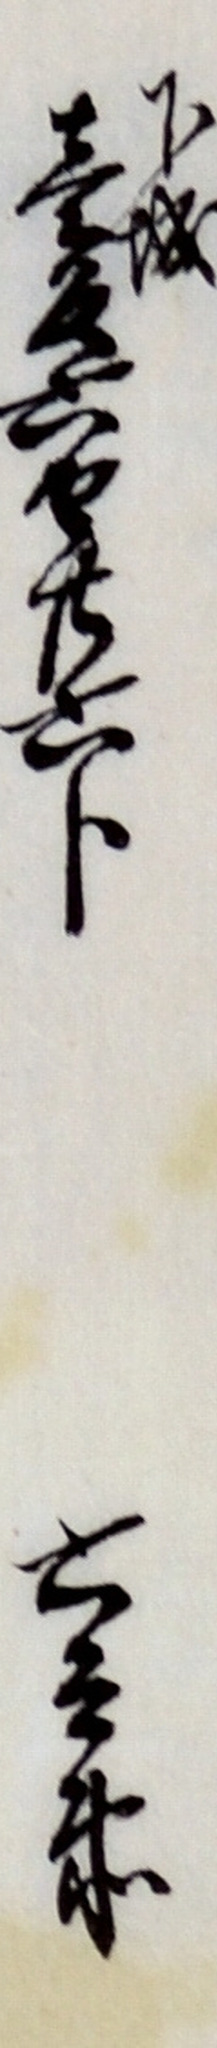壱反六セ廿六歩六兵衛
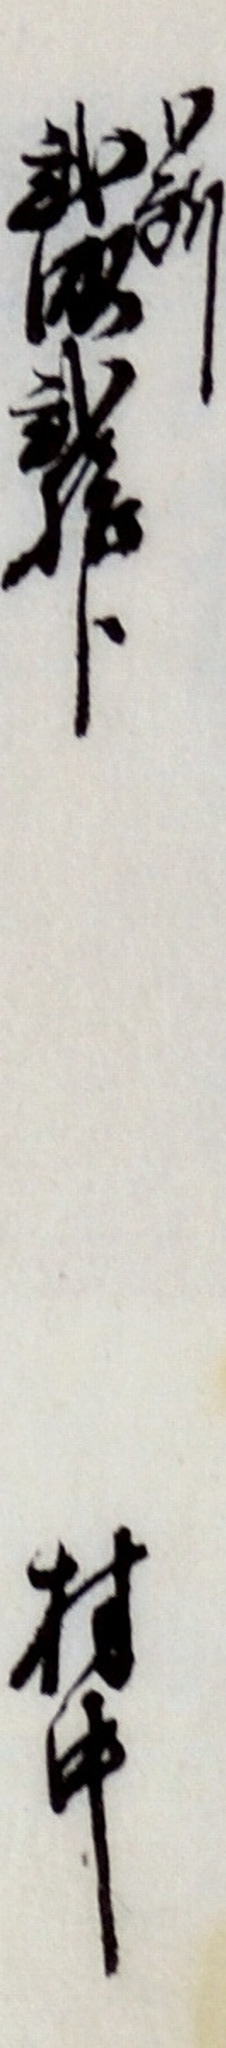弐畝弐拾歩村中
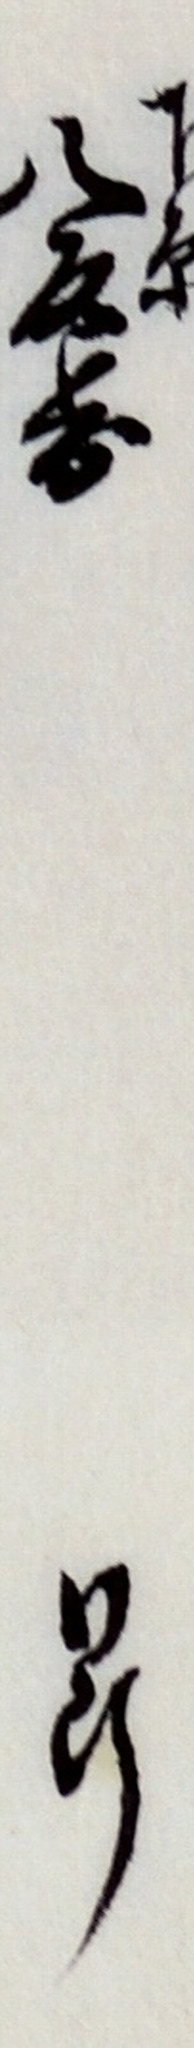八反歩同断
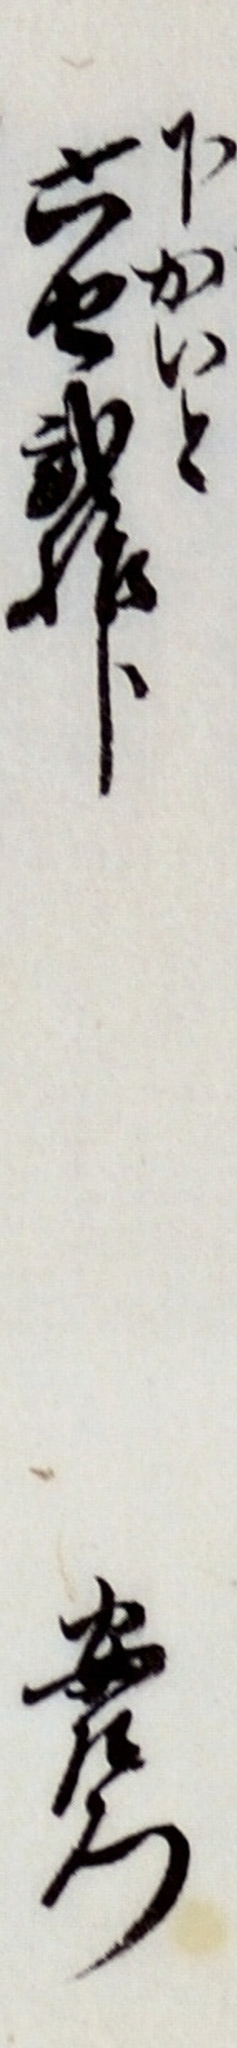六セ弐拾歩安左衛門
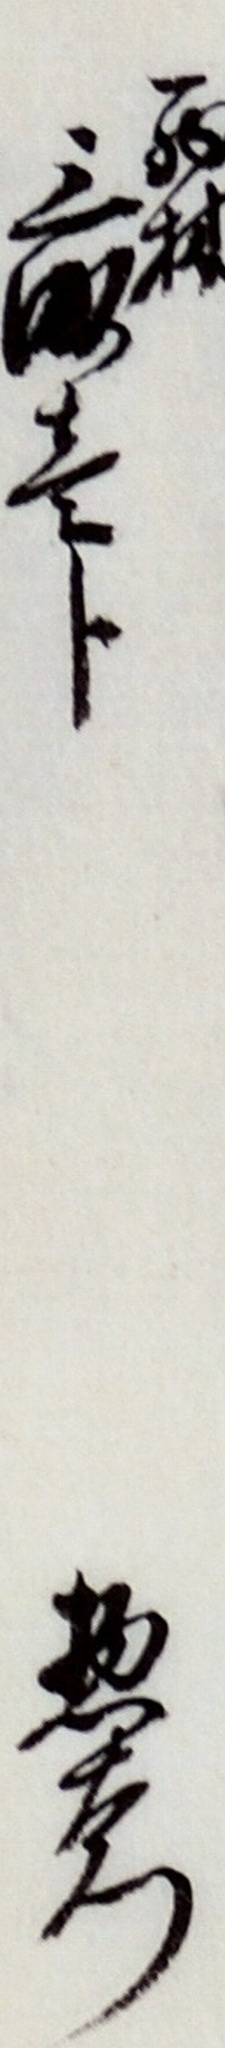三畝壱歩惣右衛門
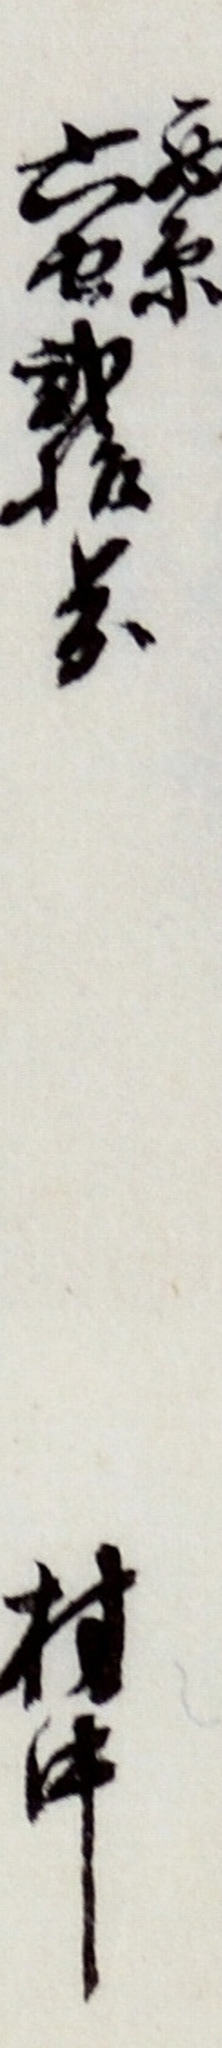六セ弐拾歩村中
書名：御領分中山林社地手控
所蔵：伊那市立高遠町図書館・合同会社AMANE
